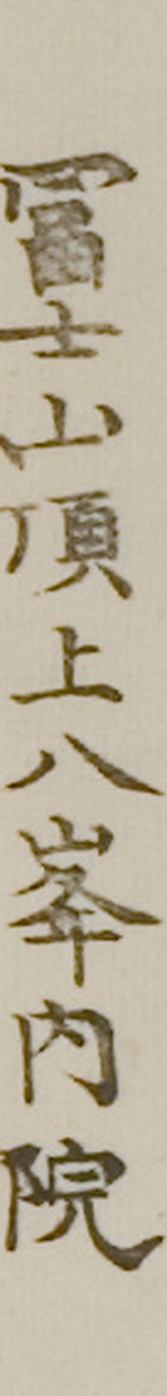富士山頂上八峯内院
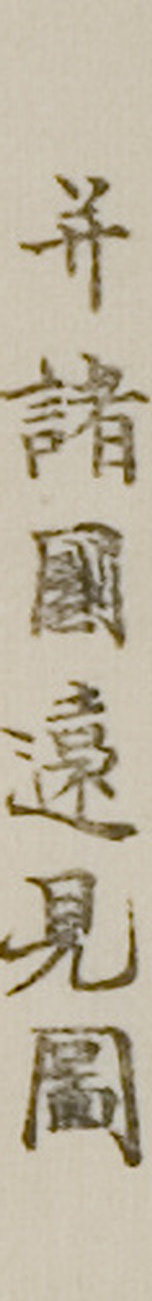并諸国遠見図
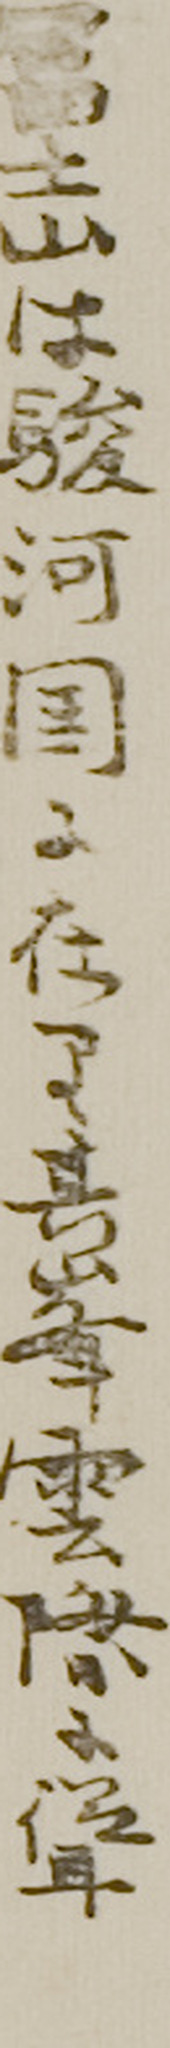富士山は駿河国に在り其峯雲際に聳
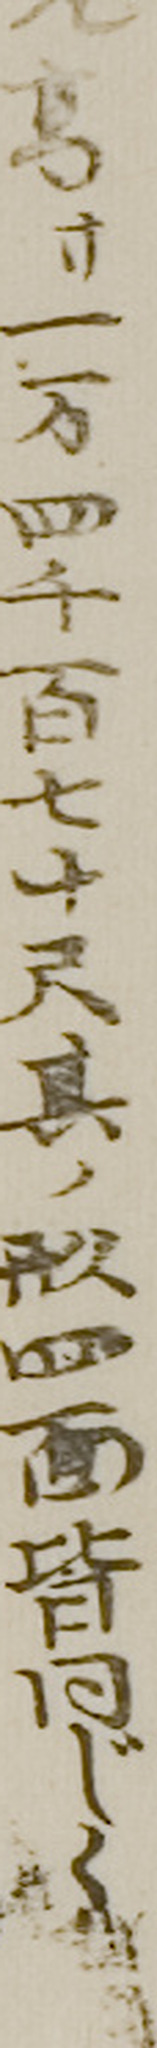え高サ一万四千百七十尺其ノ形四面皆同じく
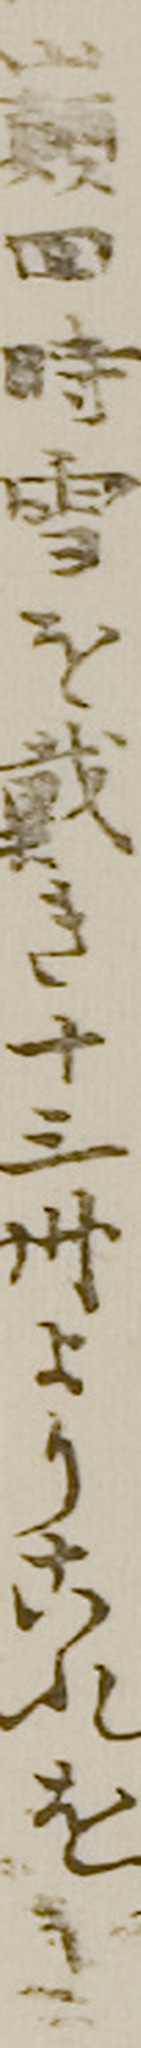山巓四時雪を戴き十三州よりこれを
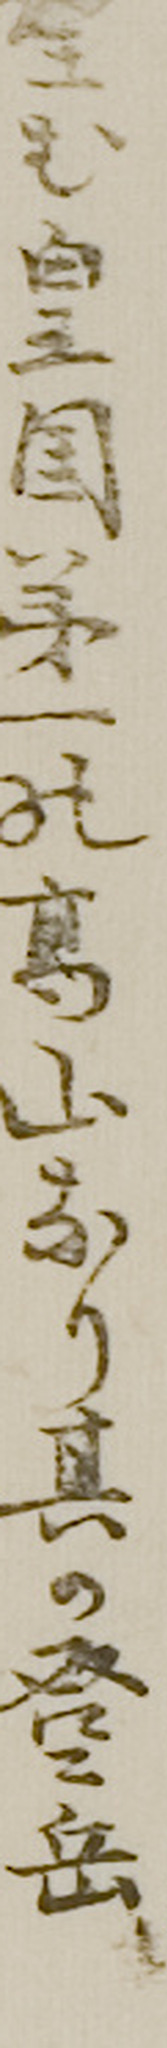望む皇国第一の高山なり其の登岳
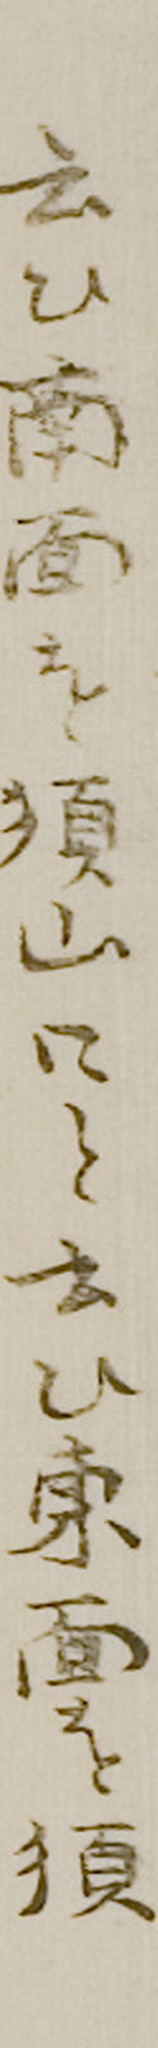云ひ南面を須山口と云ひ東面を須
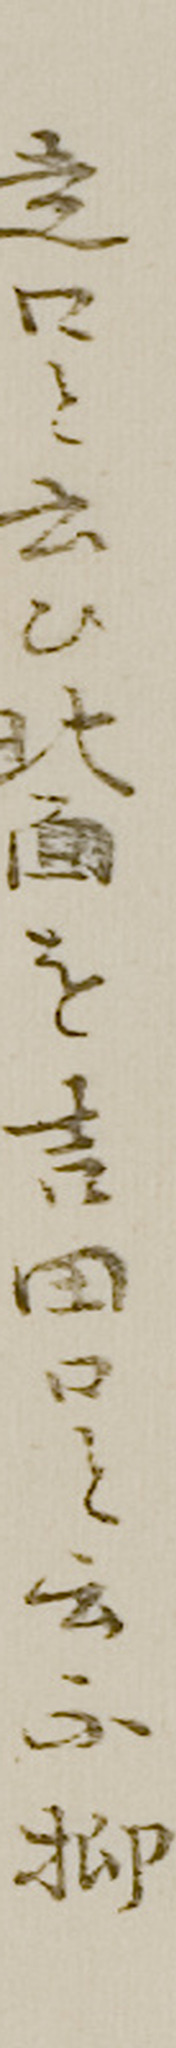走口と云ひ北面を吉田口と云ふ抑
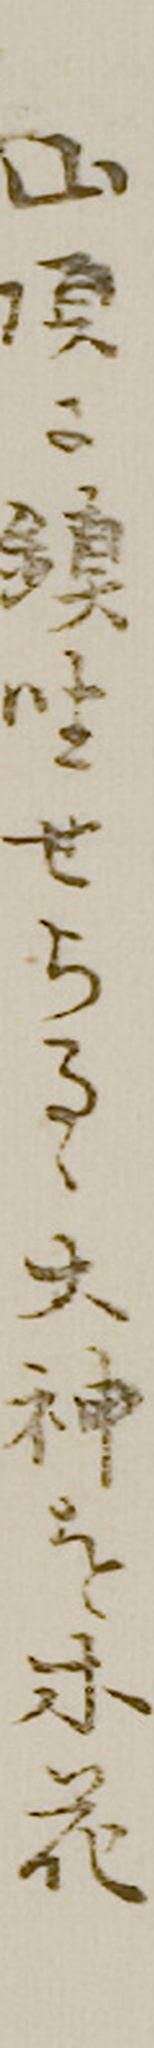山頂に鎮座せらるゝ大神を木花
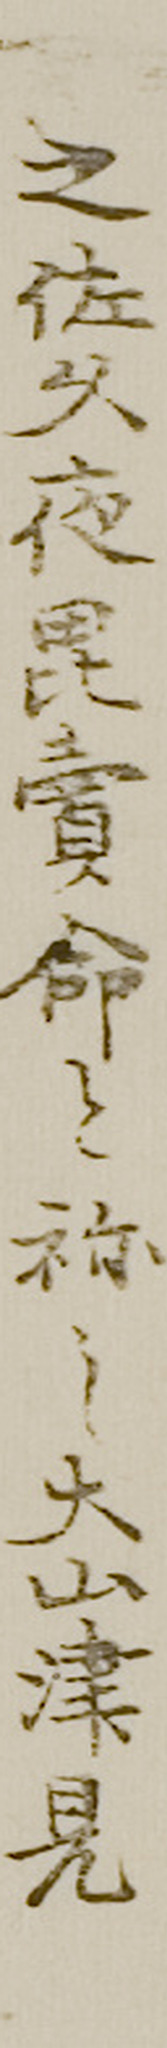之佐久夜毘賣命と称し大山津見
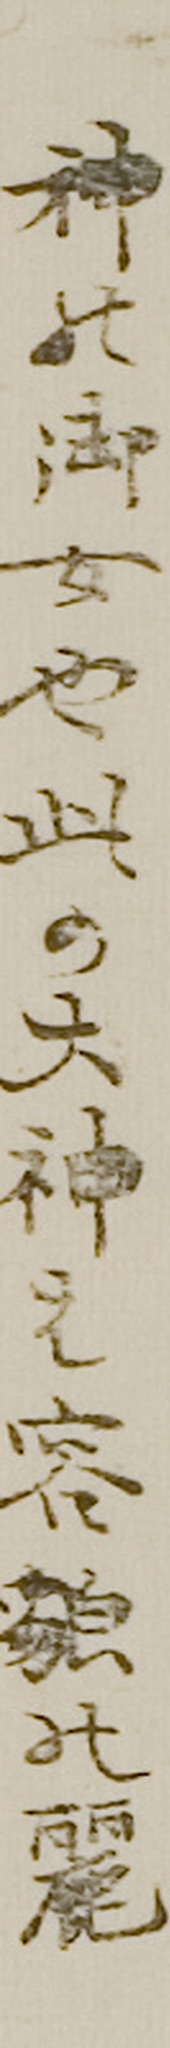神の御女也此の大神は容貌の麗
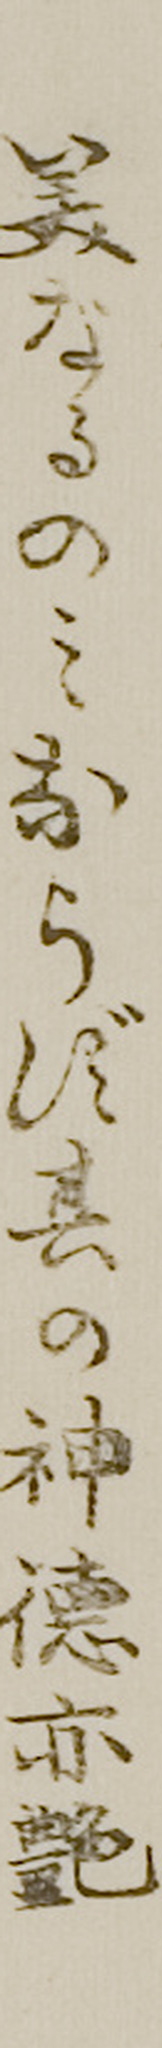美なるのみならず其の神徳亦艶
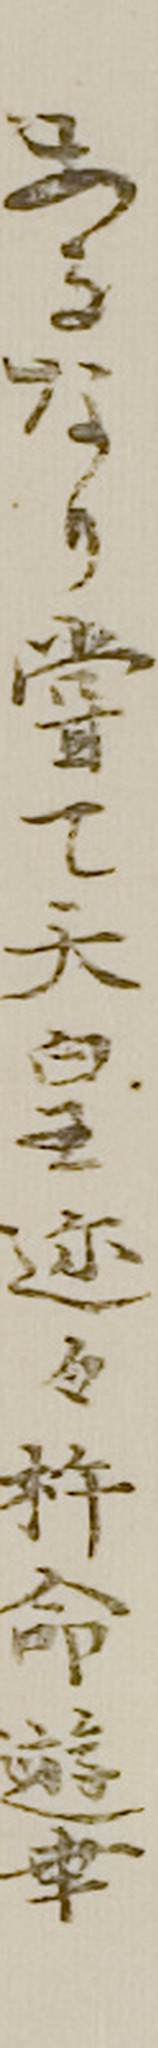あるなり嘗て天皇迩々杵命遊幸
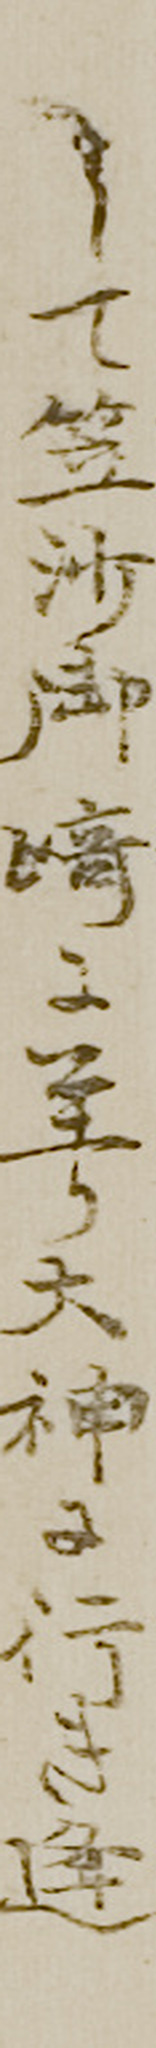して笠沙御崎に至り大神に行き逢
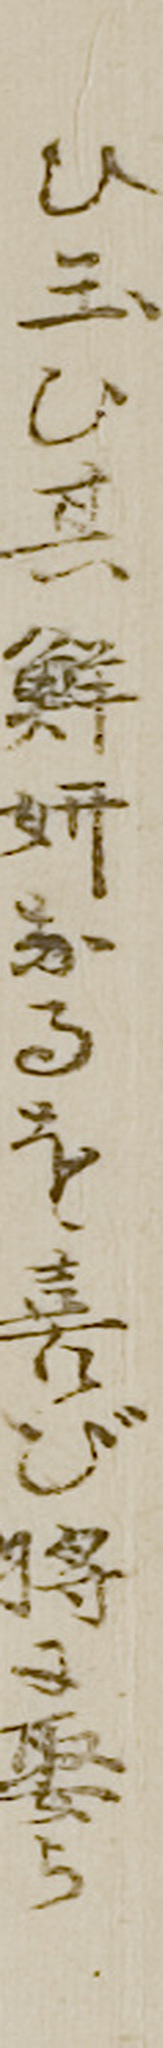ひ玉ひ其鮮姸なるを喜び将に娶ら
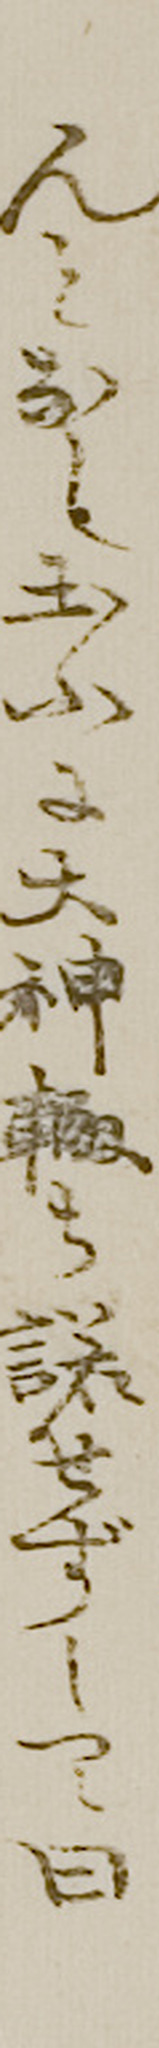んとなし玉ふに大神輙ち諾せずして曰
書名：富士山頂上八峯内院并諸国遠見図
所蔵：東京大学総合図書館 General Library in the University of Tokyo, JAPAN
